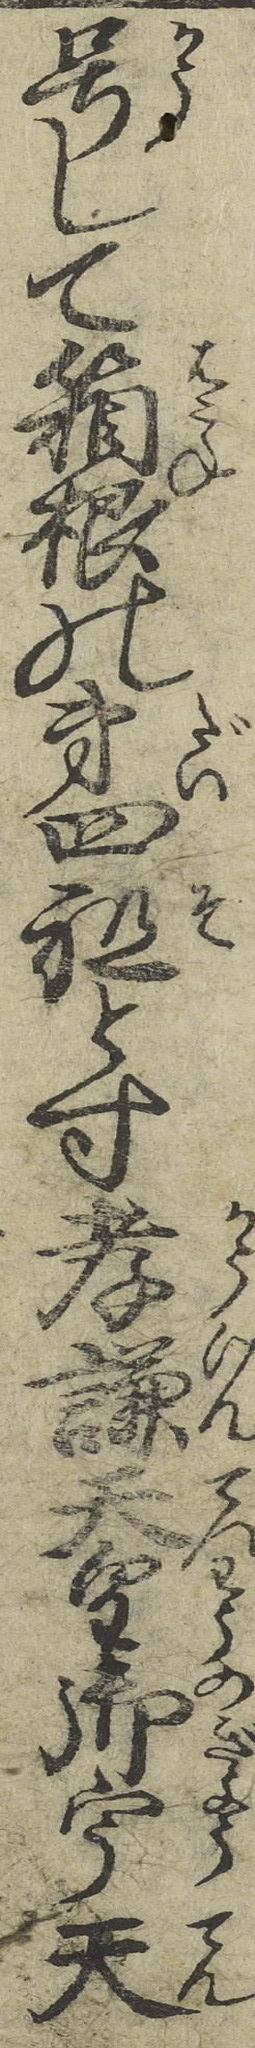号して箱根の第四祖とす孝謙天皇御宇天
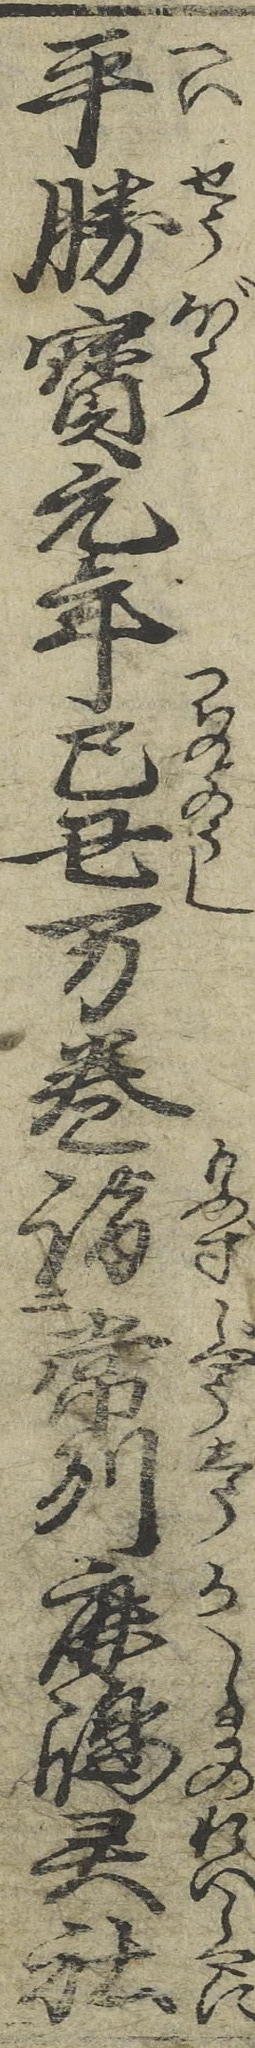平勝宝元年己丑万巻詣常州鹿嶋霊社
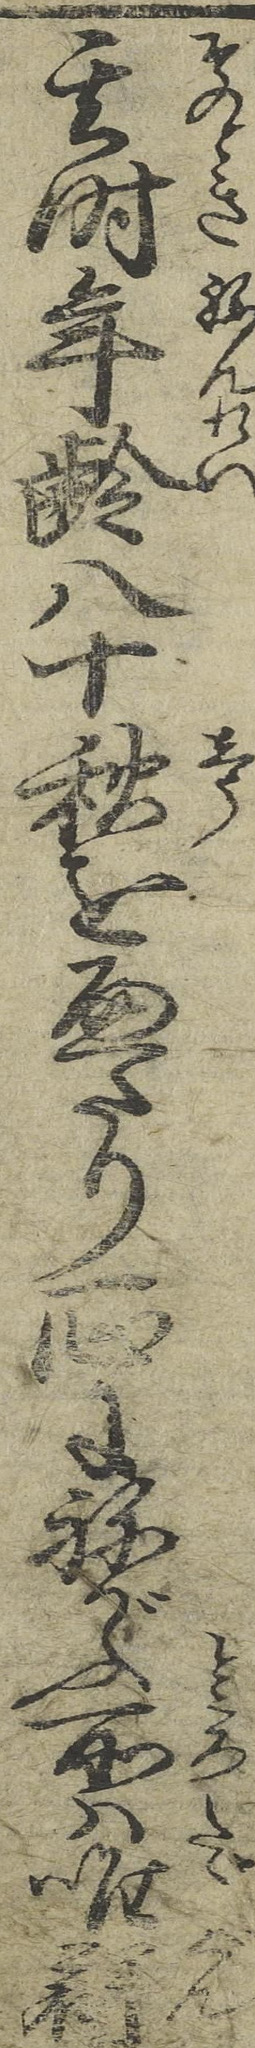其時年齢八十秋をへたり一心にねがふ所は唯群
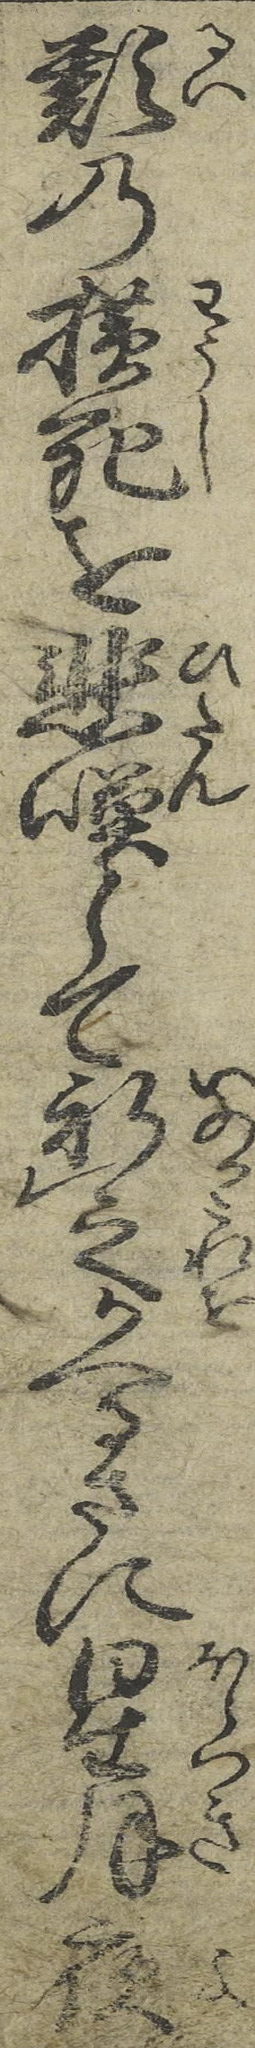類の横死を悲嘆して祈之かへるさに星月夜

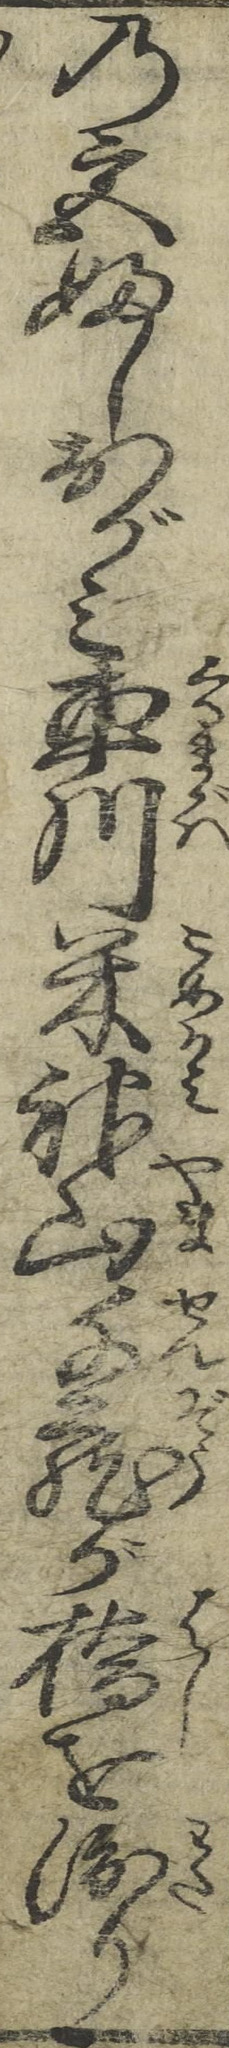の宮ふしおがみ車川米神山千蔵が橋を渡り
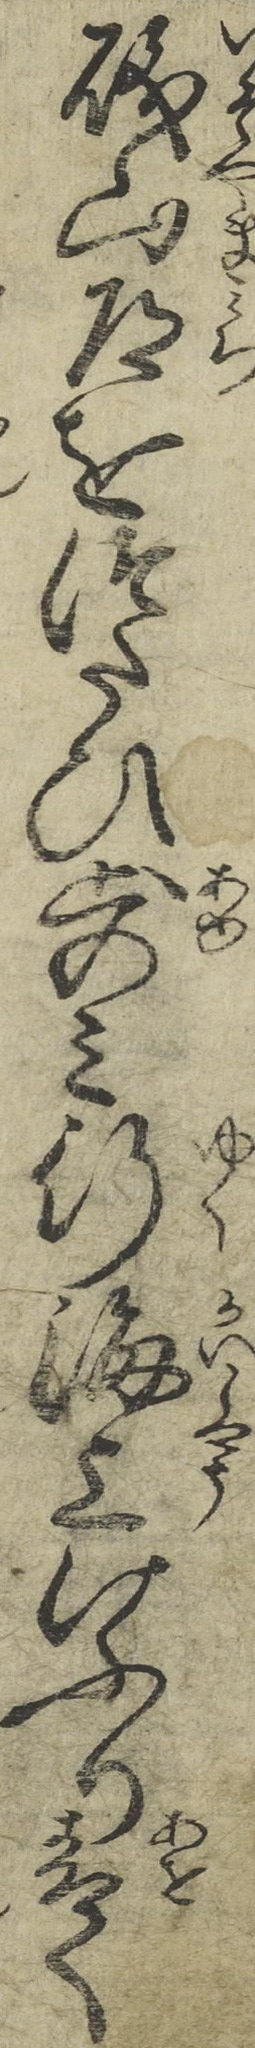磯山道をつたひ歩み行海上けふり青く
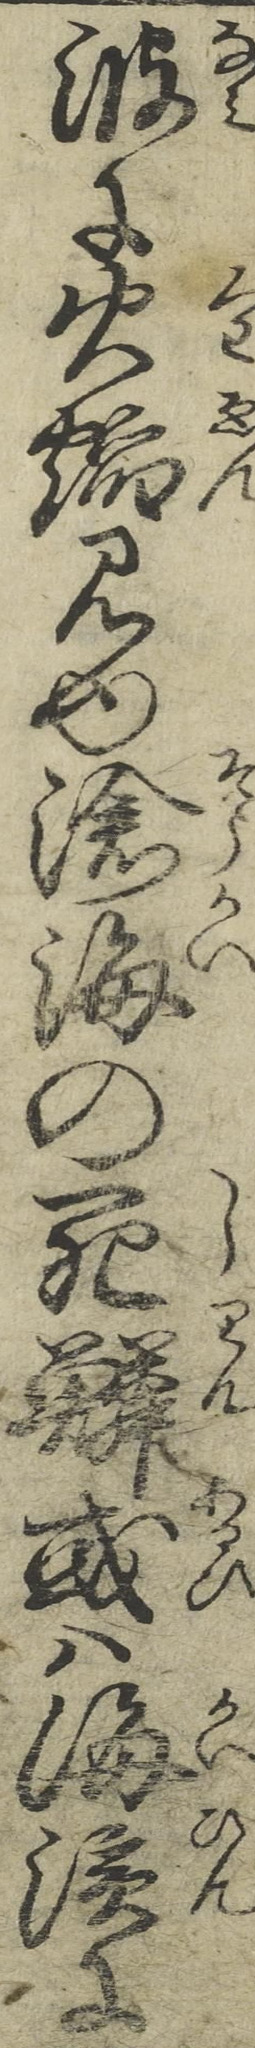波に火焔見ゆ滄海の死鱗或は海浜に
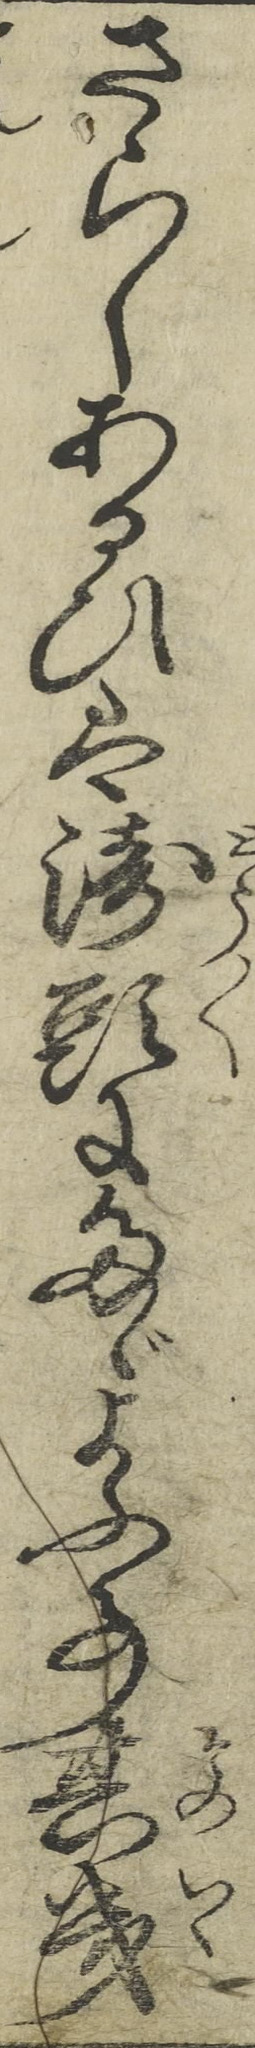さらしあるひは濤頭にたゞよふ事其幾
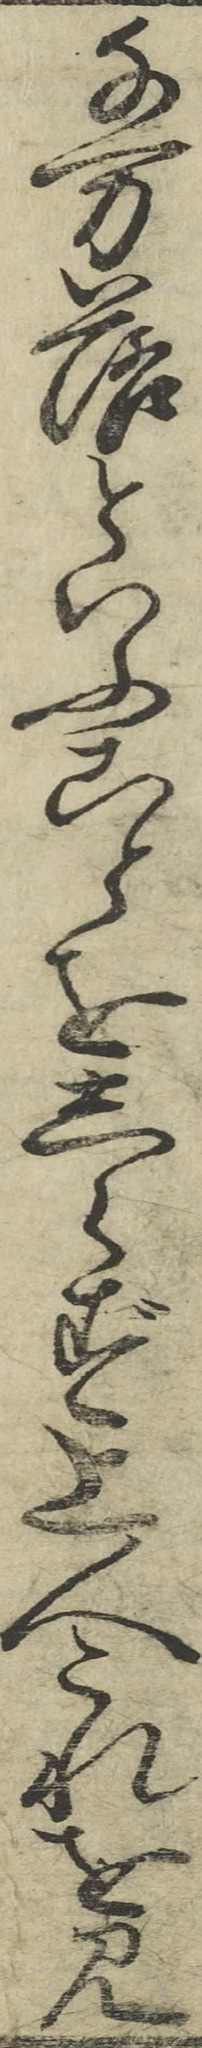千万落といふことをしらず上人これを見
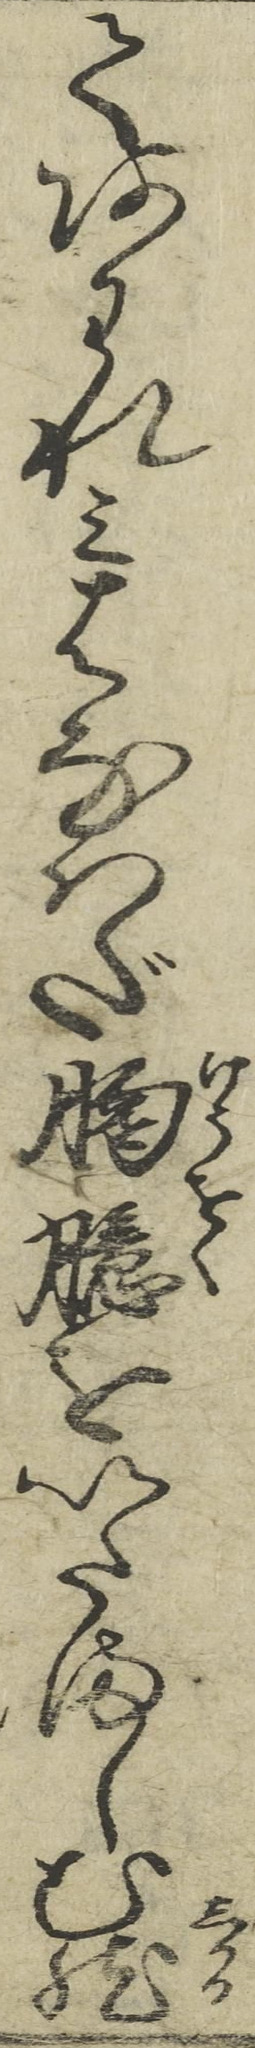てあわれみはなはだ胸臆をいたましむ然
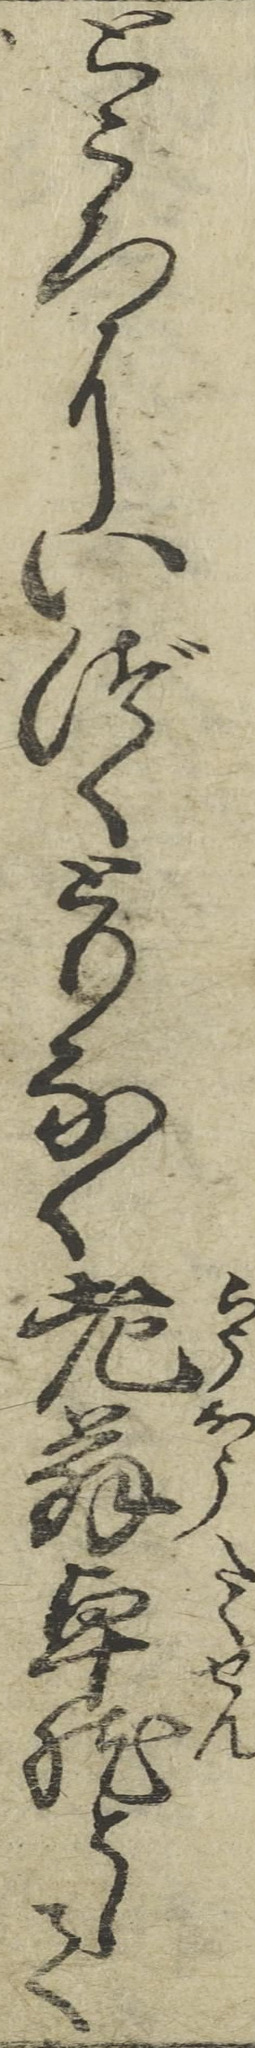ところにいづくともなく老翁卓然として
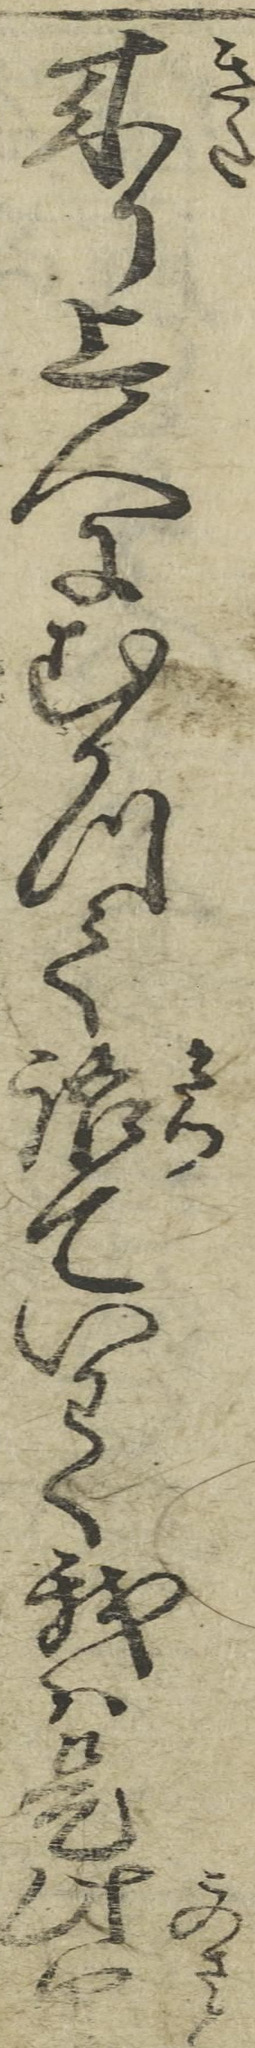来り上人にむかつてきつていわく我は是此里
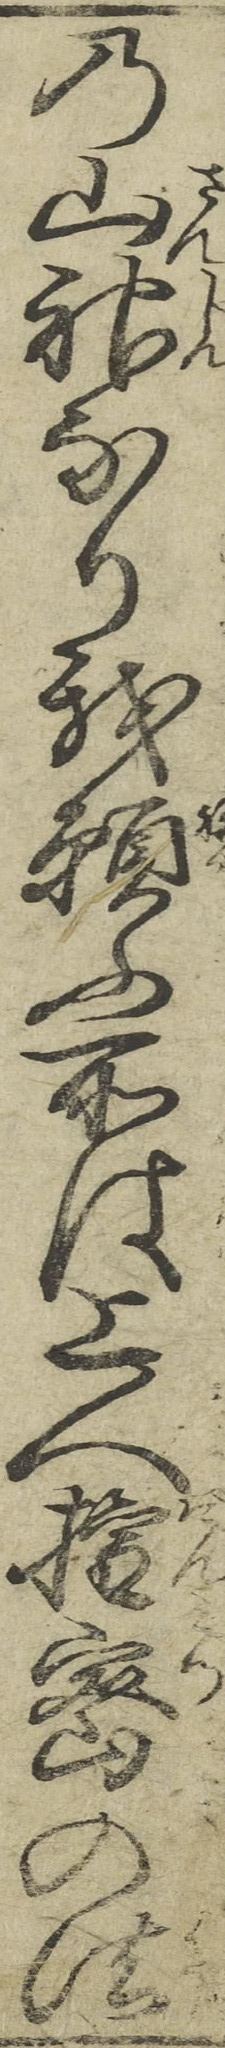の山神なり我願ふ所は上人の壇密の法
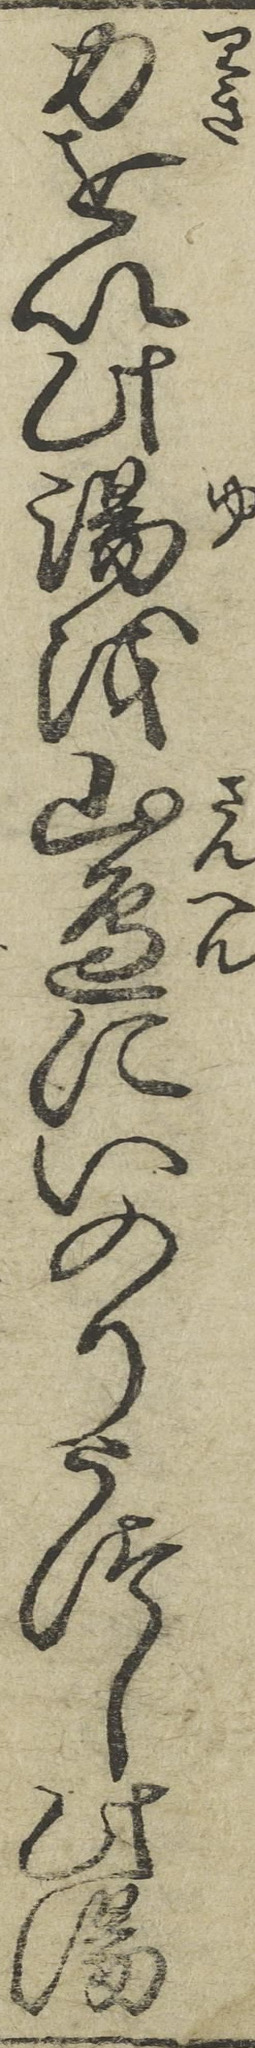力を以此湯を山辺にいのりうつし此湯
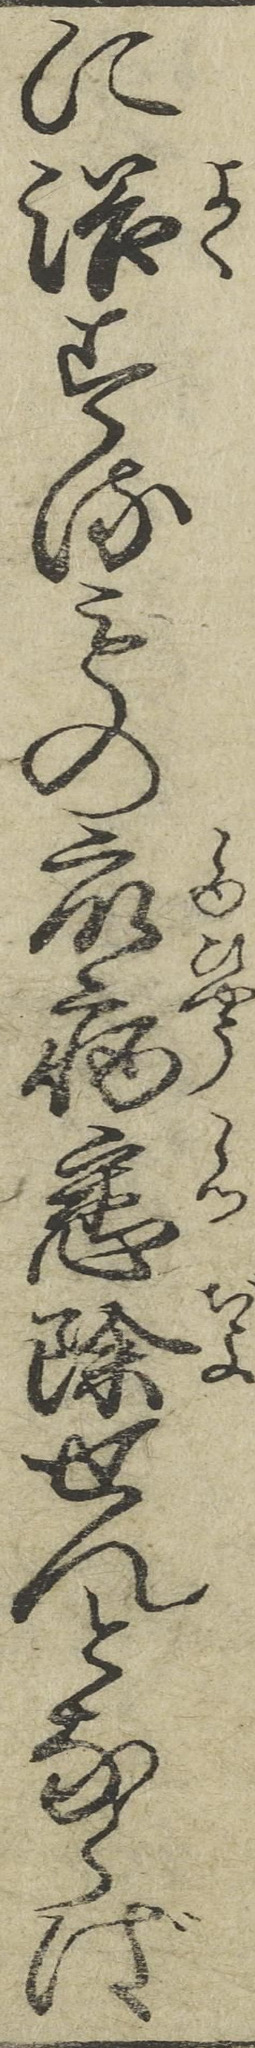に浴するもの衆病悉除せんとならば
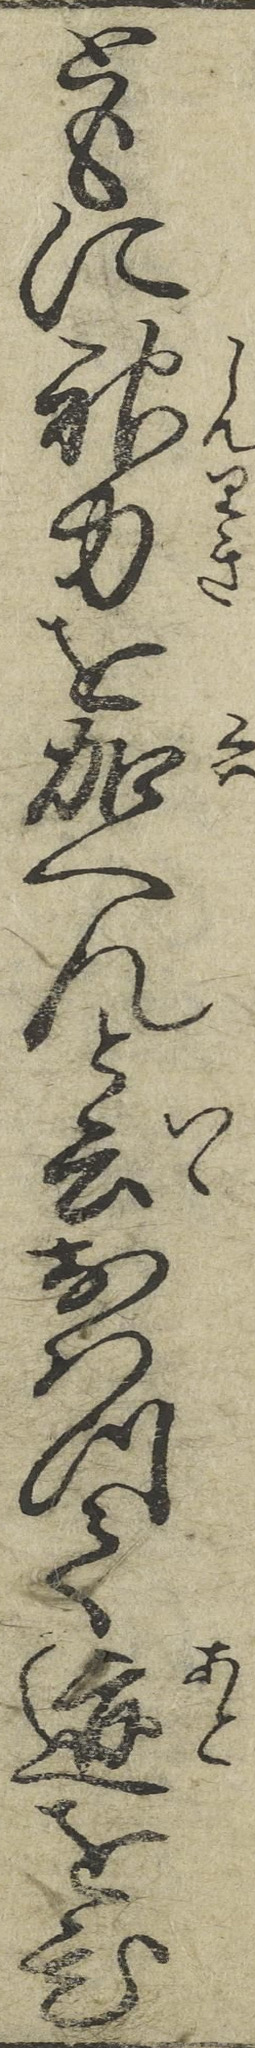ともに神力を加へんと言おはつて迹をひ
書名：伊豆國熱海温泉縁起
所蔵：東京大学地震研究所図書室 Earthquake Research Institute Library, The University of Tokyo, JAPAN
